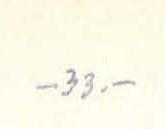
33.
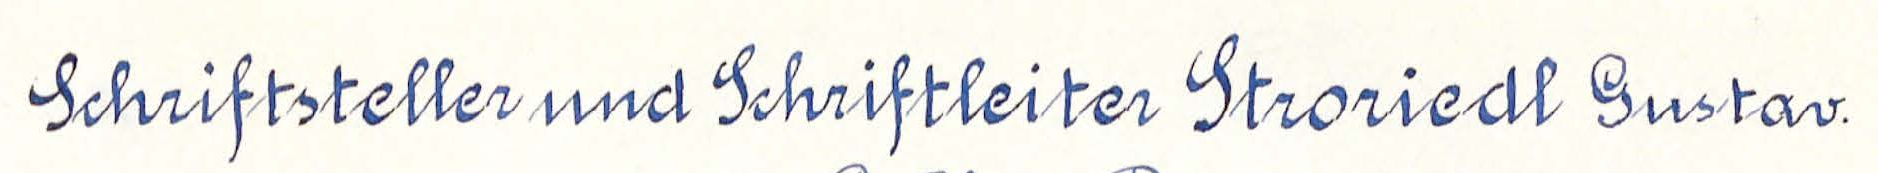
Schriftsteller und Schriftleiter Stroriedl Gustav
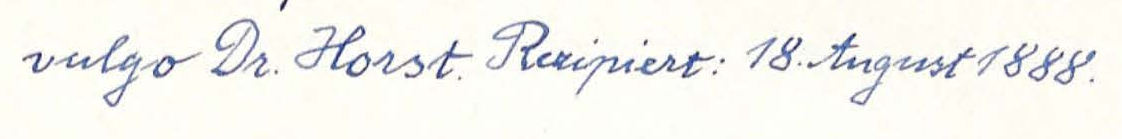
vulgo Dr. Horst. Rezipiert: 18. August 1888.
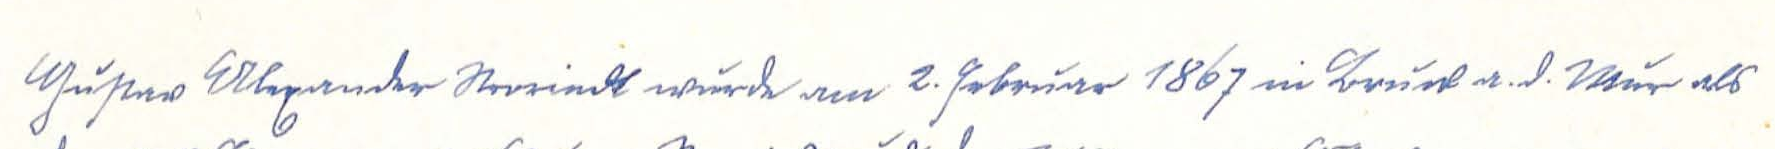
Gustav Alexander Stroriedl wurde am 2. Februar 1867 in Bruck a. d. Mur als
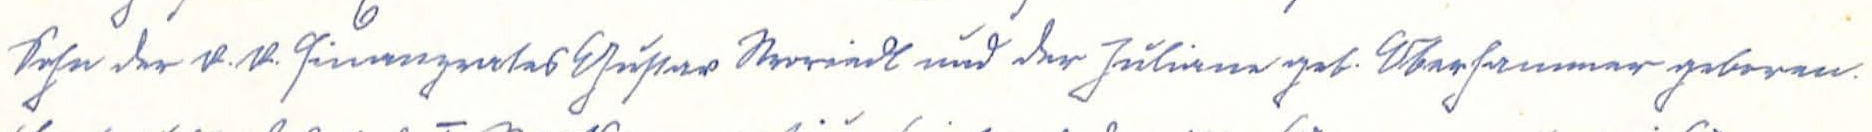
Sohn des k. k. Finanzrates Gustav Stroriedl und der Juliane geb. Oberhammer geboren.
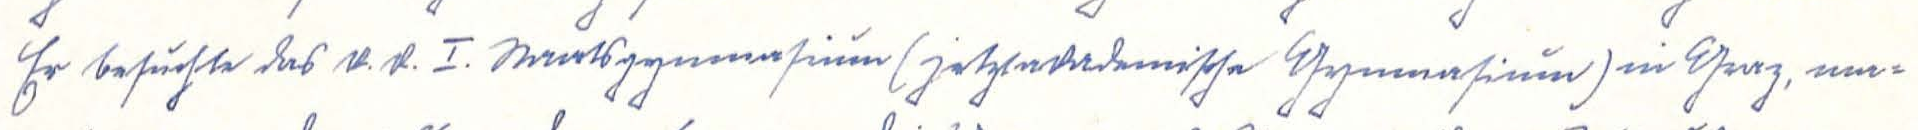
Er besuchte das k. k. I. Staatsgymnasium (jetz akademische Gymnasium ) in Graz, ma-
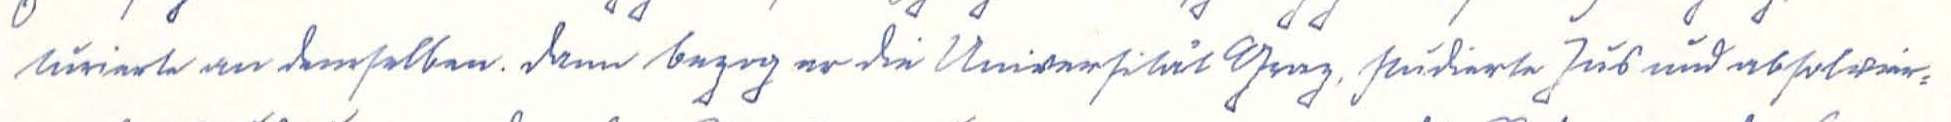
turierte an demselben. Dann bezog er die Universität Graz, studierte Jus und absolvier-
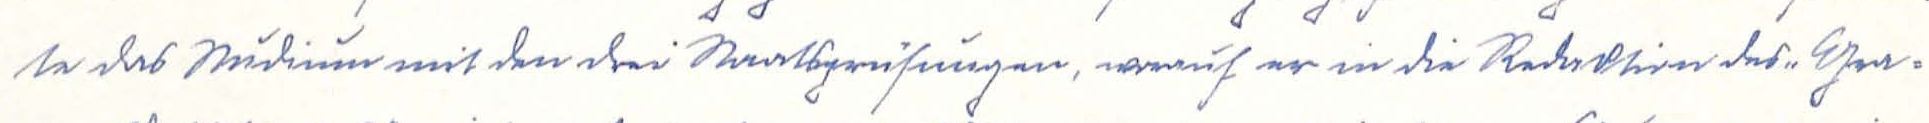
te das Studium mit den drei Staatsprüfungen, worauf er in die Redaktion des "Gra-
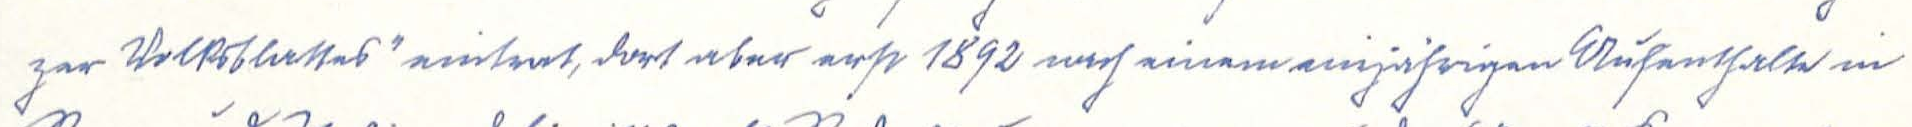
zer Volksblattes“ eintrat, dort aber erst 1892 nach einem einjährigen Aufenthalte in
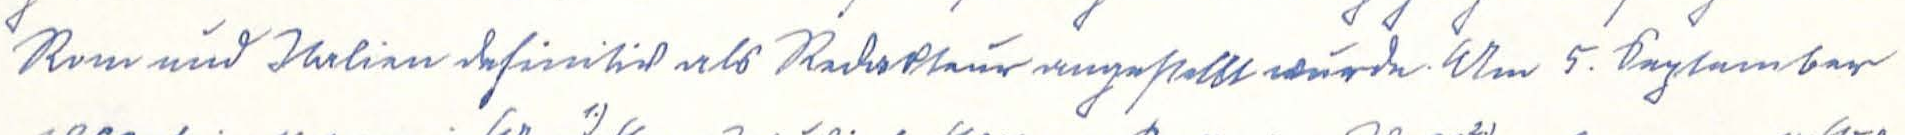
Rom und Italien definitiv als Redakteur angestellte wurde. Am 5. September
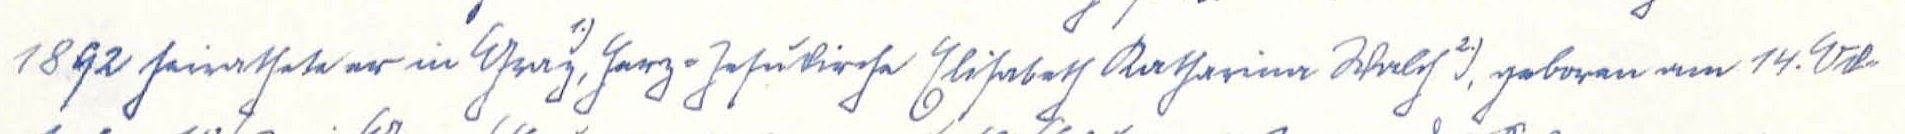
1892 heiratete er in Graz 1.), Herz-Jesukirche Elisabeth Katharina Walch 2.), geboren am 14. Ok-
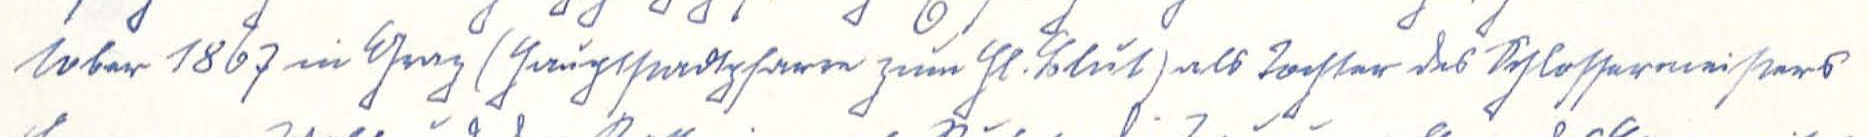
tober 1867 in Graz (Hauptstadtpfarre zum Hl. Blut) als Tochter des Schlossermeisters
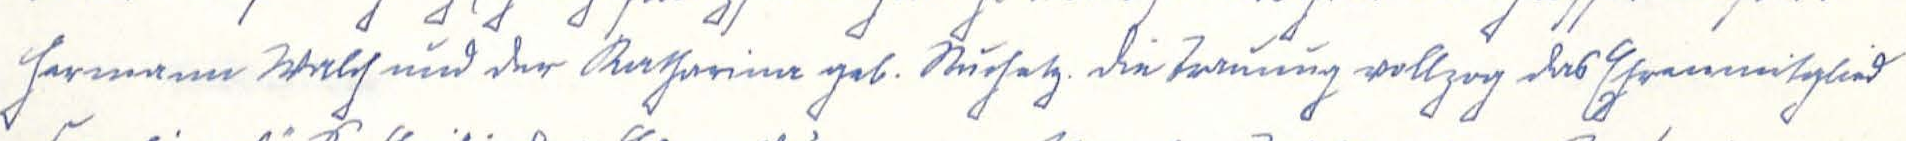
Hermann Walch und der Katharina geb. Stuchetz. Die Trauung vollzog das Ehrenmitglied
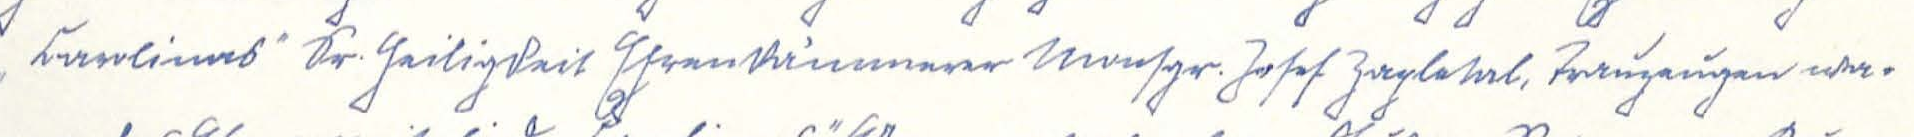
"Carolinas" Sn. Heiligkeit Ehrenkämmerer Monsgr. Josef Zapletal, Trauzeugen war-
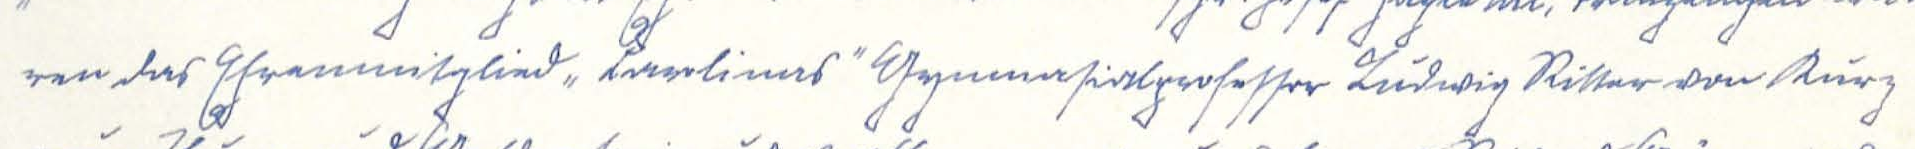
ren das Ehrenmitglied "Carolinas" Gymnasialprofessor Ludwig Ritter von Kurz
